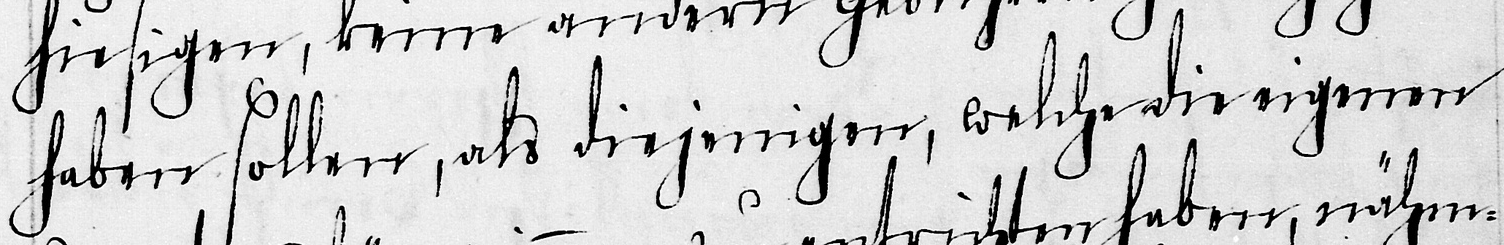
haben sollen, als diejenigen, welche die eigenen
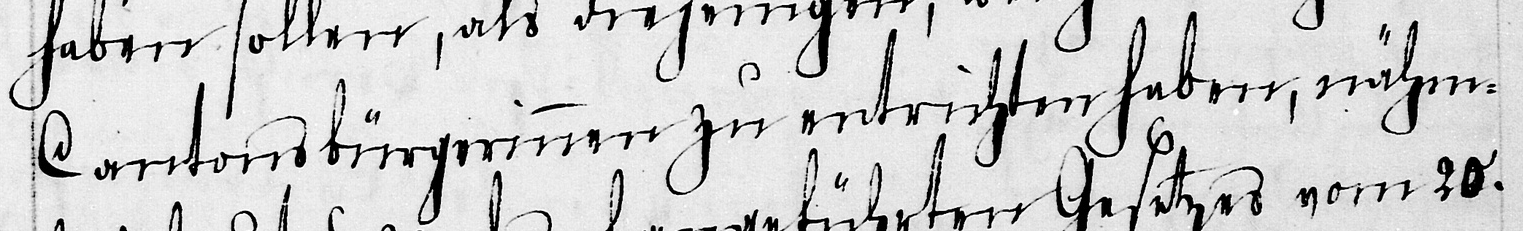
Cantonsbürgerinnen zu entrichten haben, nähm¬
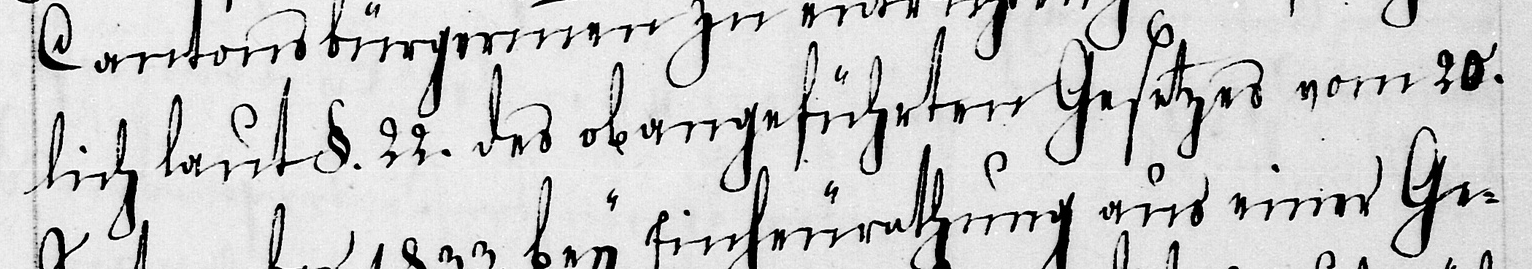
lich laut §. 22. des obangeführten Gesetzes vom 20.
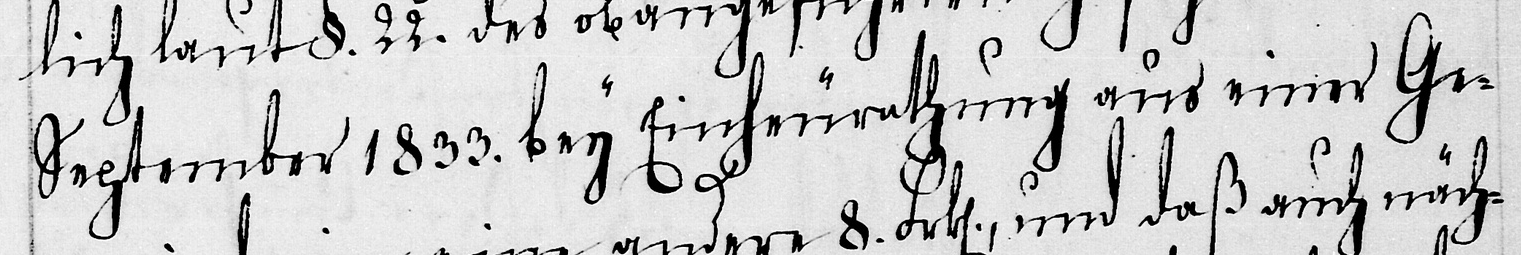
September 1833. bey Einheurathung aus einer Ge¬
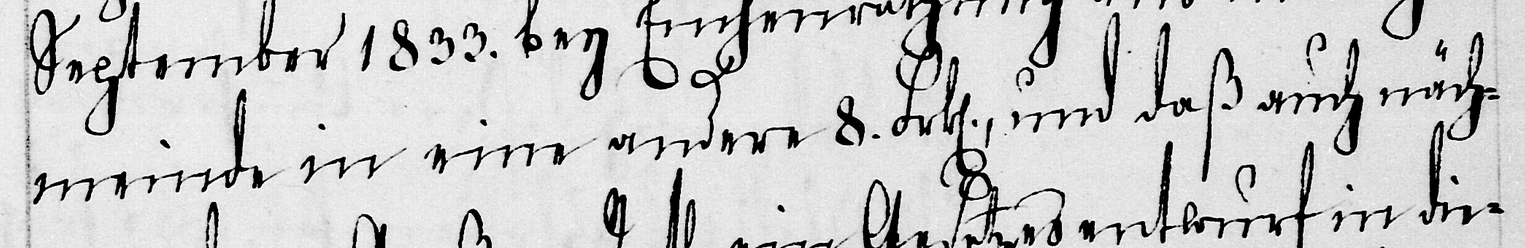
meinde in eine andere 8. Frk[en]., und daß auch näch¬
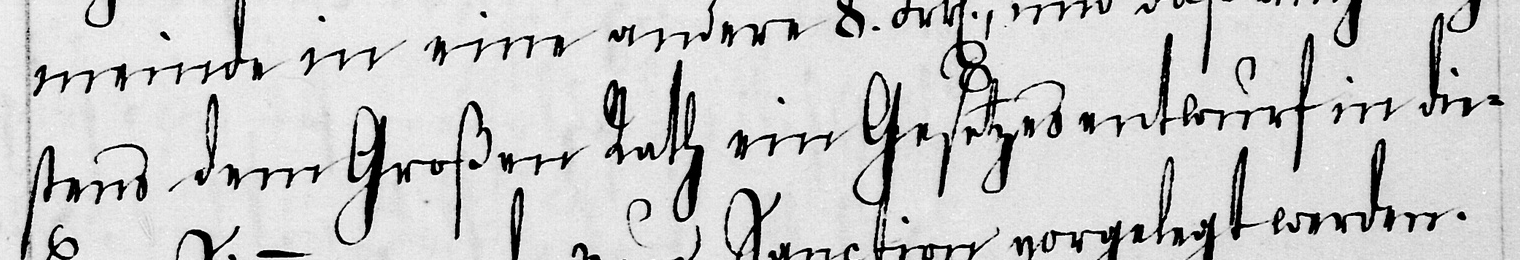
stens dem Großen Rath ein Gesetzesentwurf in die¬
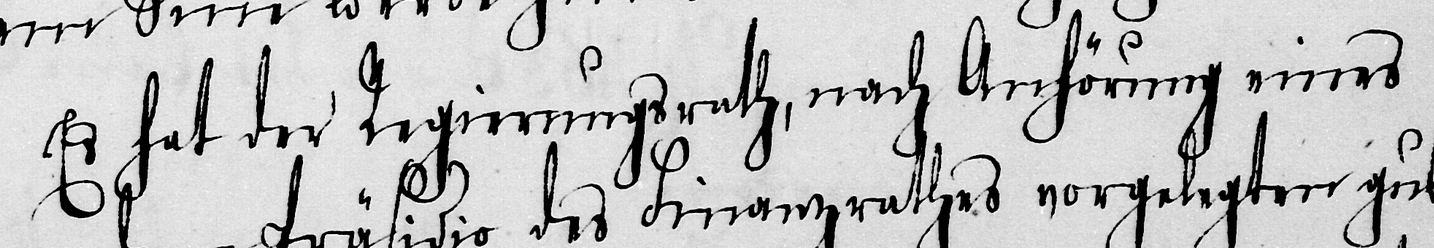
Es hat der Regierungsrath, nach Anhörung eines
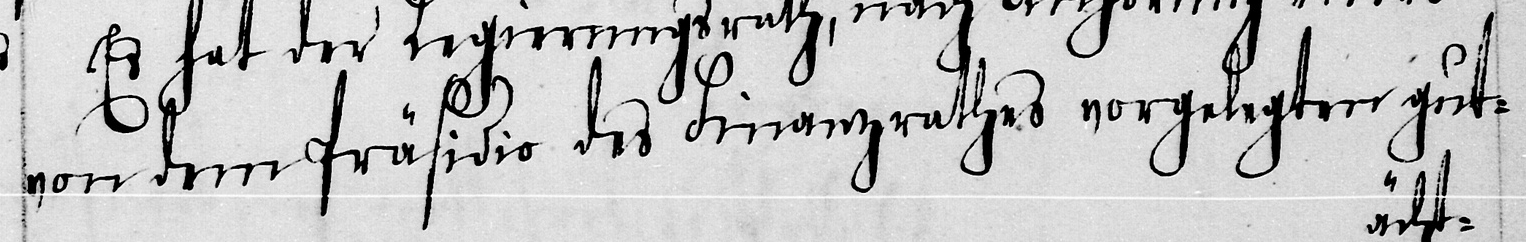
von dem Präsidio des Finanzrathes vorgelegten gut-
